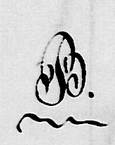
B.
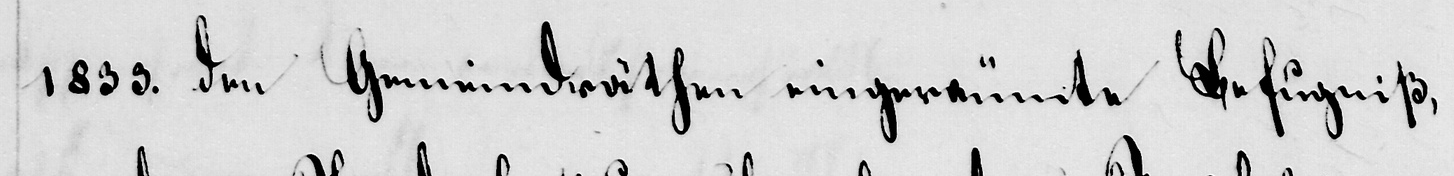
1833. den Gemeindräthen eingeräumte Befugniß,
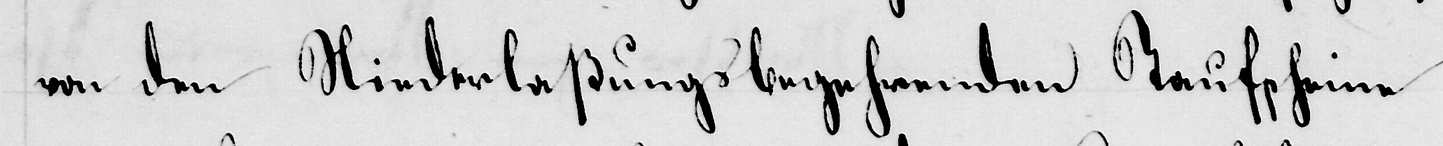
von den Niederlaßungsbegehrenden Taufscheine
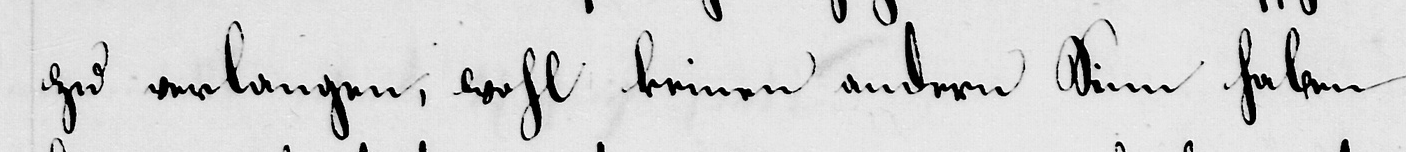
zu verlangen, wohl keinen andern Sinn haben
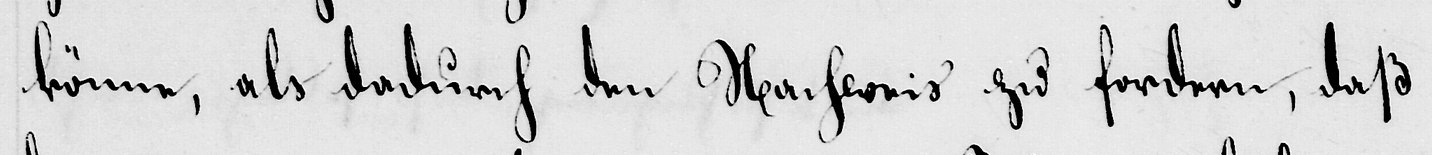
könne, als dadurch den Nachweis zu fordern, daß
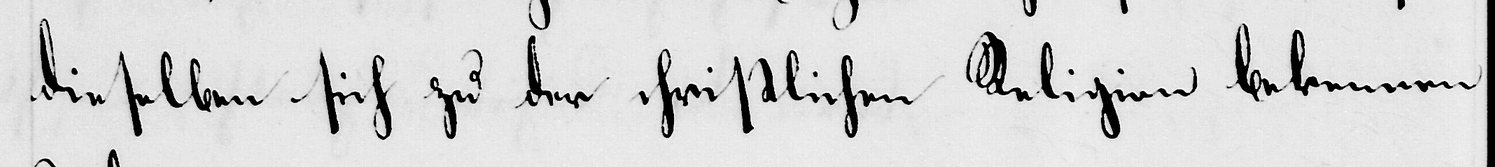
dieselben sich zu der christlichen Religion bekennen
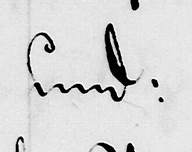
und:
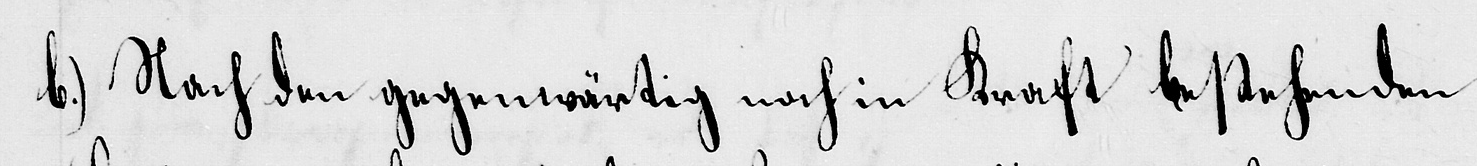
b.) Nach den gegenwärtig noch in Kraft bestehenden
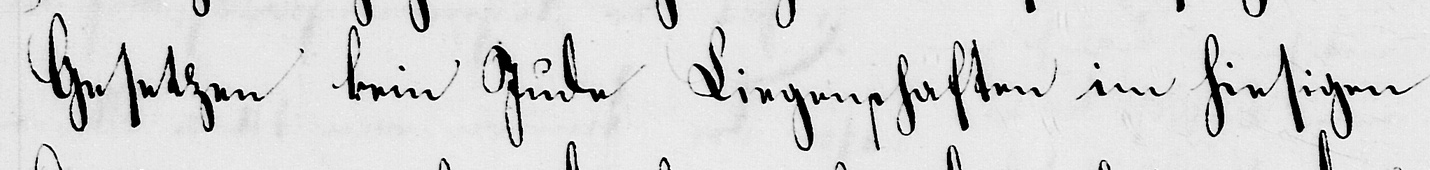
Gesetzen kein Jude Liegenschaften im hiesigen
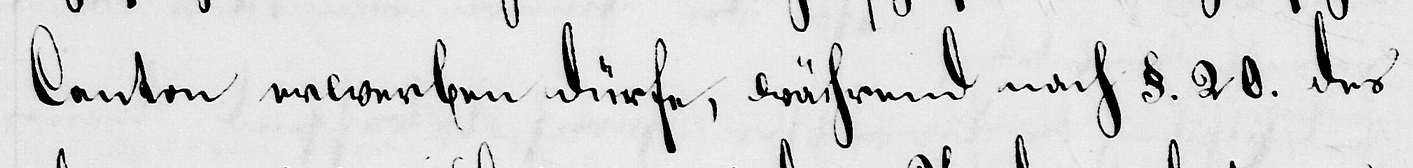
Canton erwerben dürfe, während nach §. 20. des
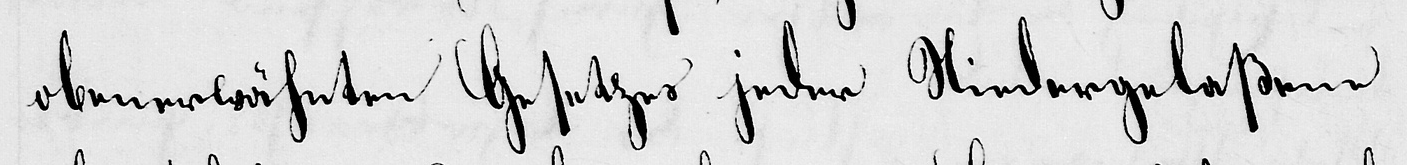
obenerwähnten Gesetzes jeder Niedergelaßene
